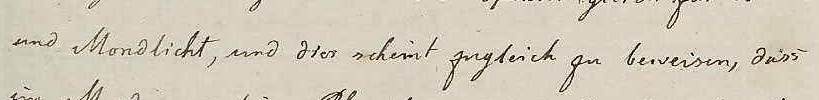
und Mondlicht, und dies scheint zugleich zu beweisen, dass
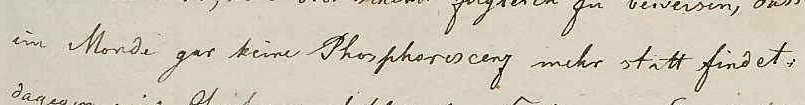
im Monde gar keine Phosphorescenz mehr statt findet:
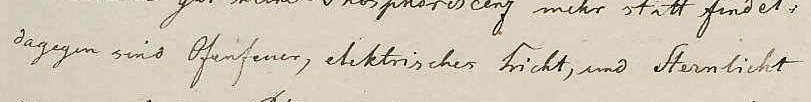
dagegen sind Ofenfeuer, elektrisches Licht, und Sternlicht
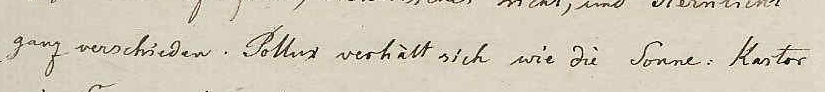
ganz verschieden. Pollux verhält sich wie die Sonne: Kastor
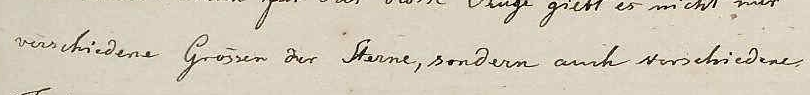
verschiedene Grössen der Sterne, sondern auch verschiedene
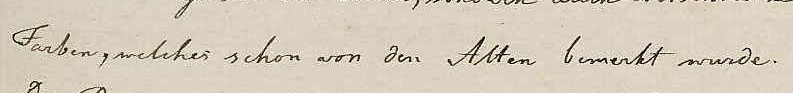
Farben, welches schon von den Alten bemerkt wurde.
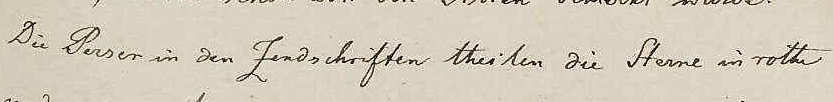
Die Perser in den Zendschriften theilen die Sterne in rothe
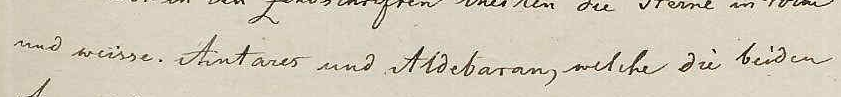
und weisse. Antares und Aldebaran, welche die beiden
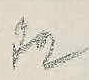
roth:
